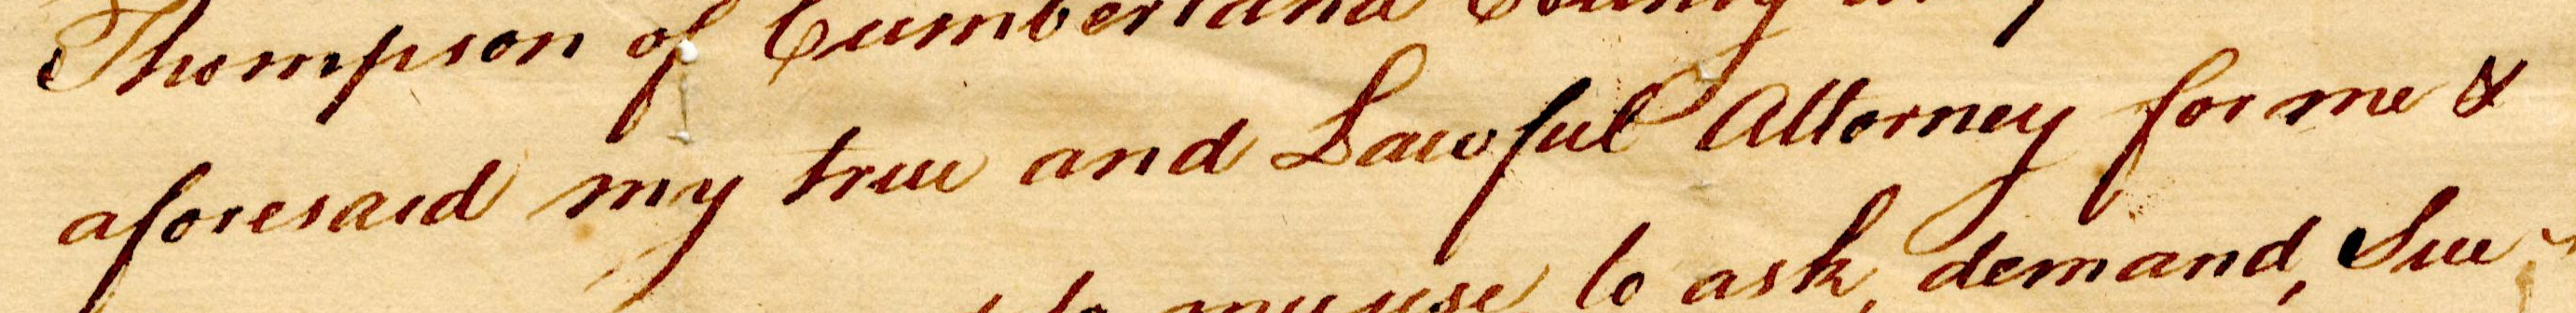aforesaid my true and Lawful Attorney for me &
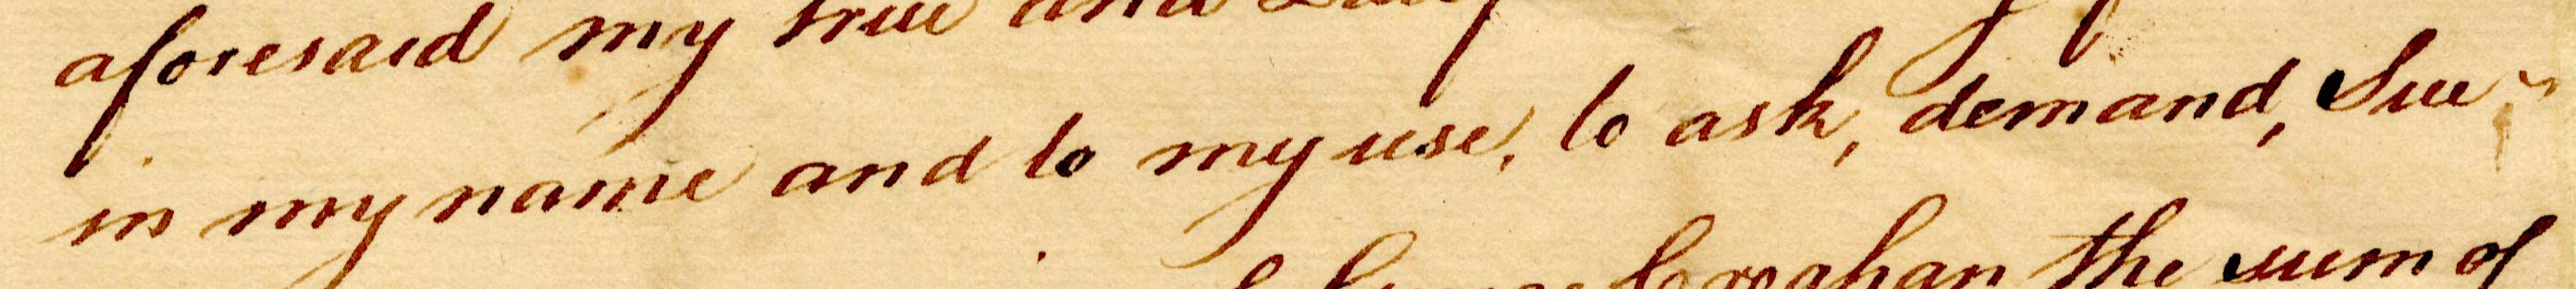in my name and to my use, to ask, demand See
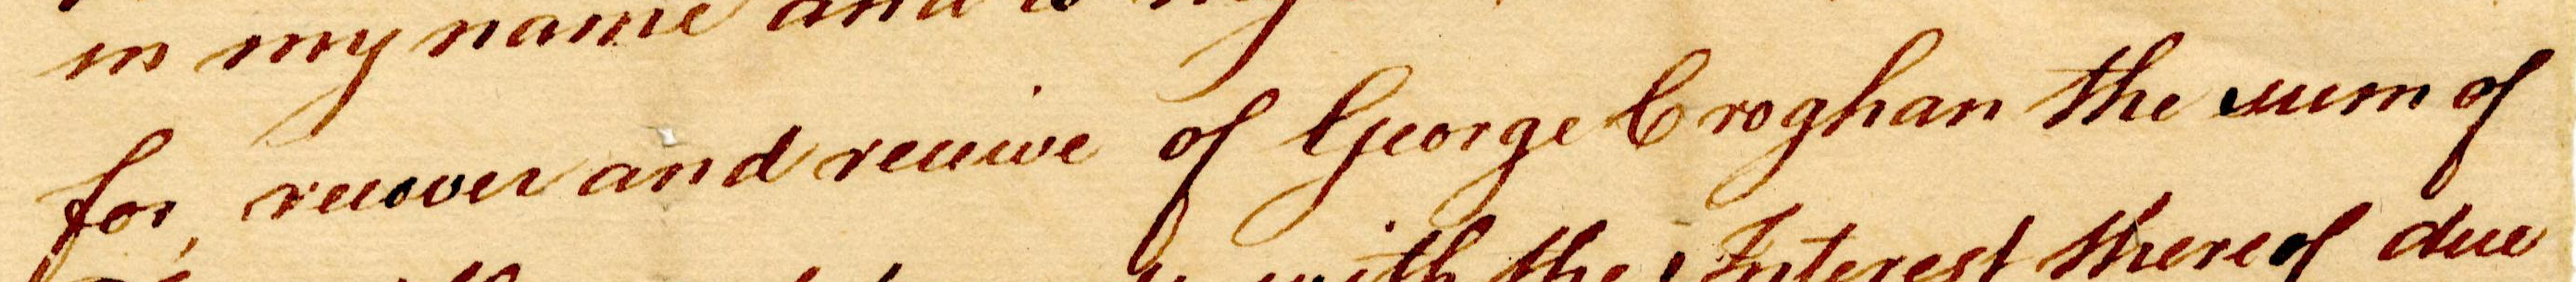for recover and receive of George Croghan the sum of
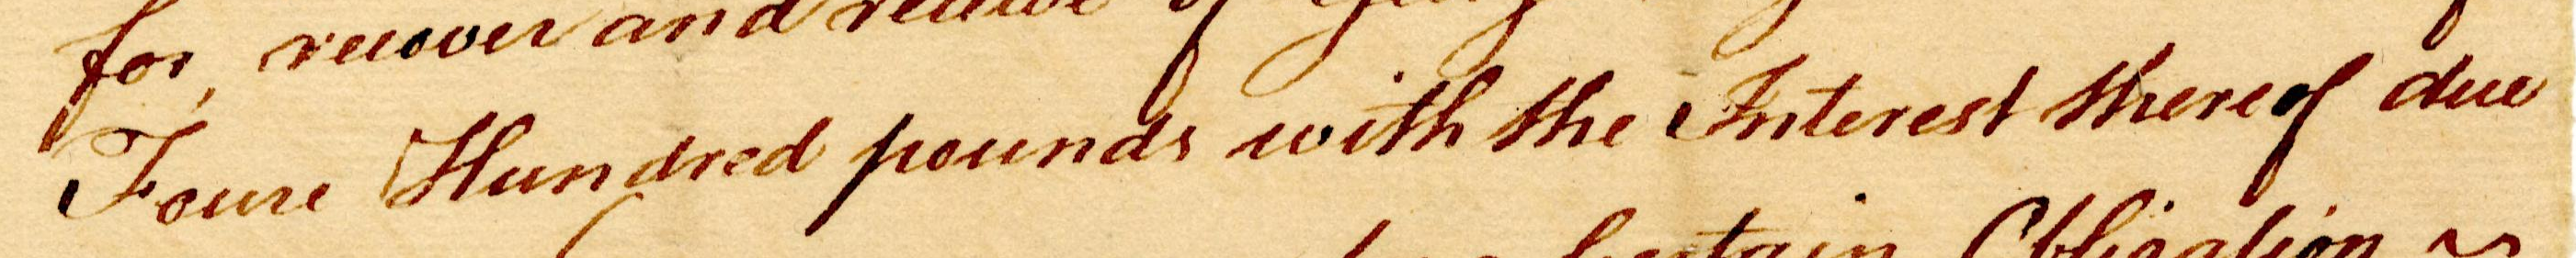Foure Hundred pounds with the Interest thereof due
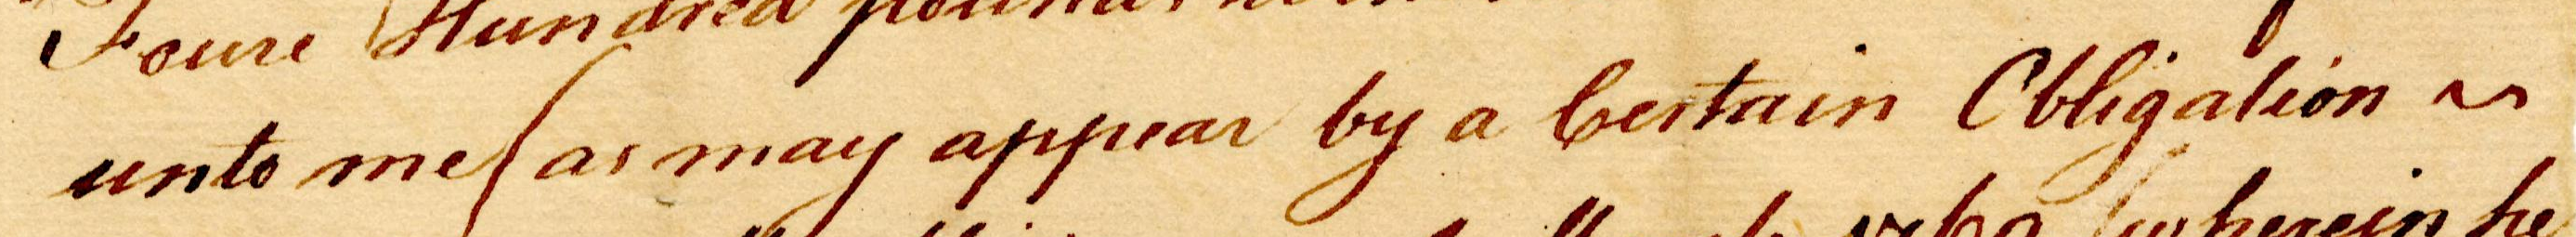unto me / as may appear by a Certain Obligation-
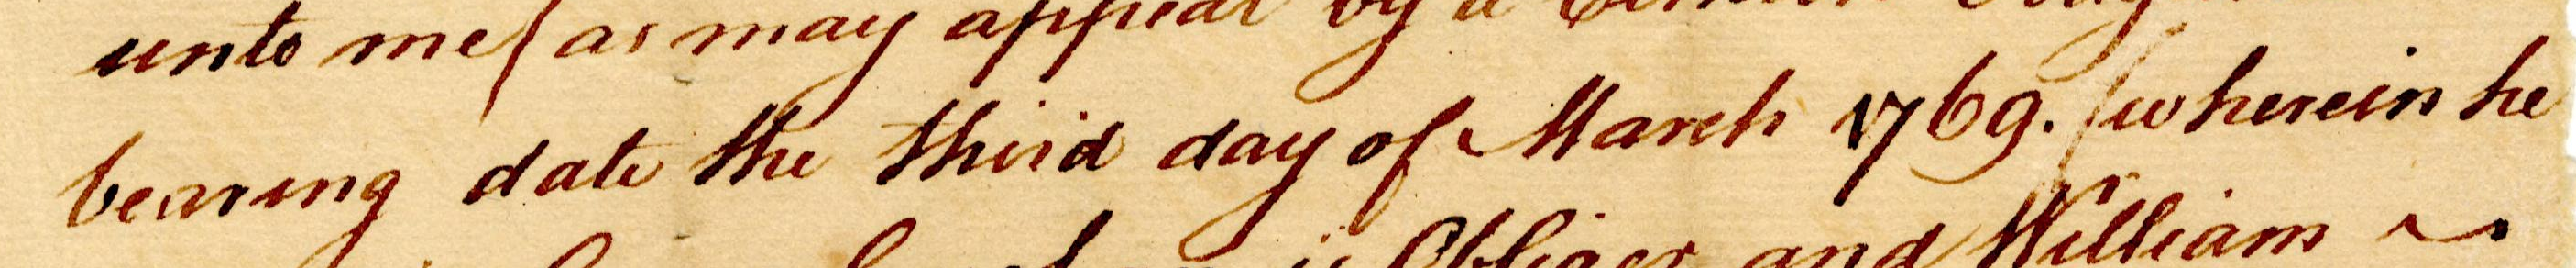bearing date the third day of March 1769. (wherein he
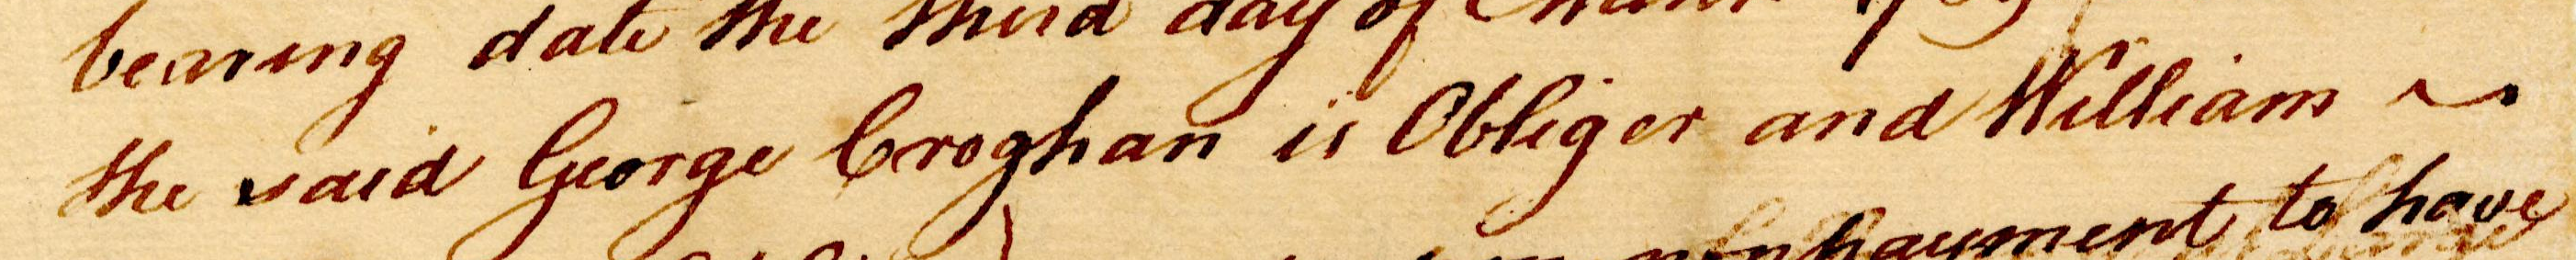the sadd George Croghan is Obliger and William
